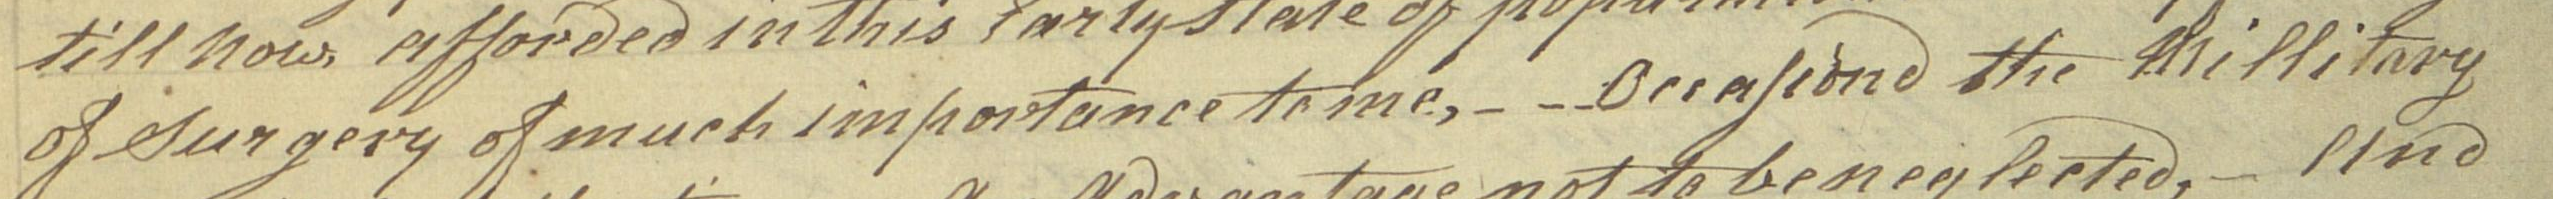of Surgery of much importance to me, occasiond the Millitary
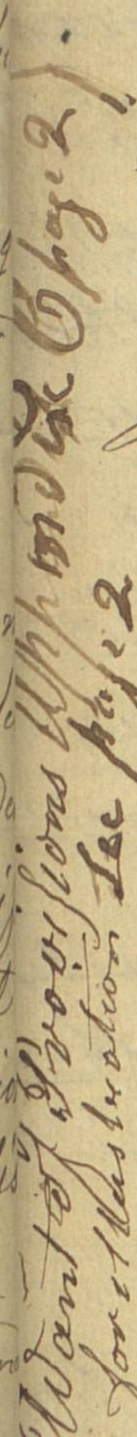Want of Provisions Appendix (page 2)
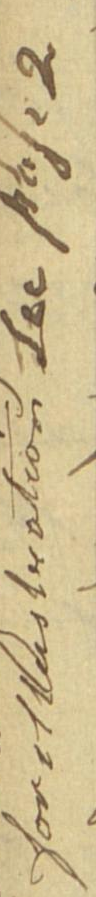for ellastration see page 2
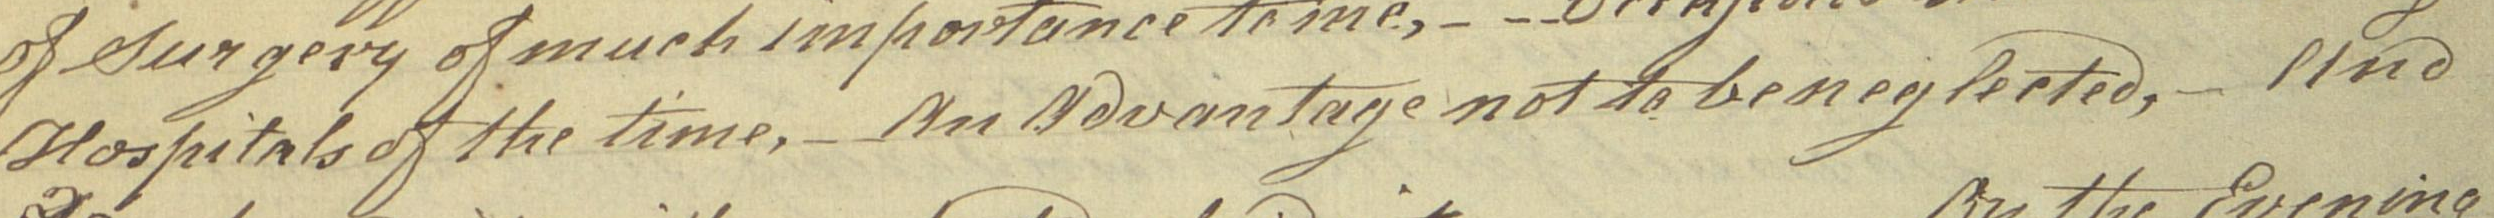Hospitals of the time, An advantage not to be neglected, And
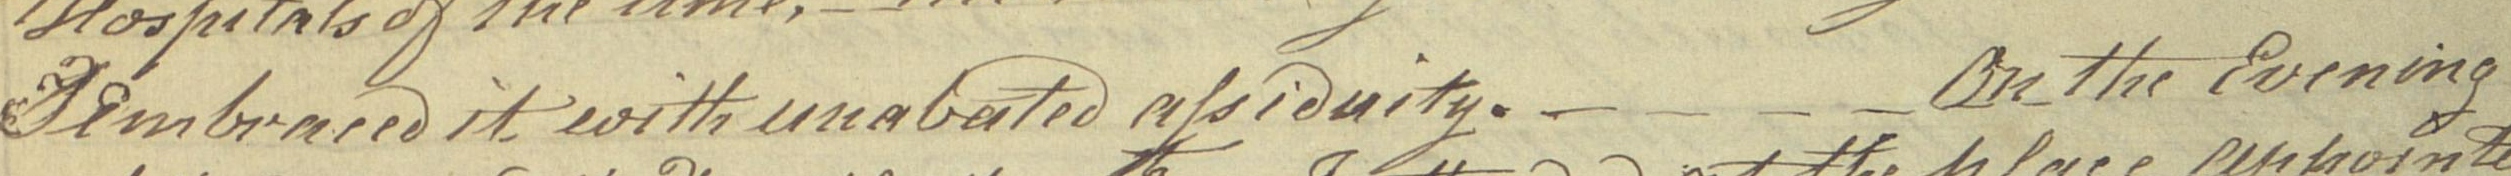I embraced it with unabated assiduity. On the Evening
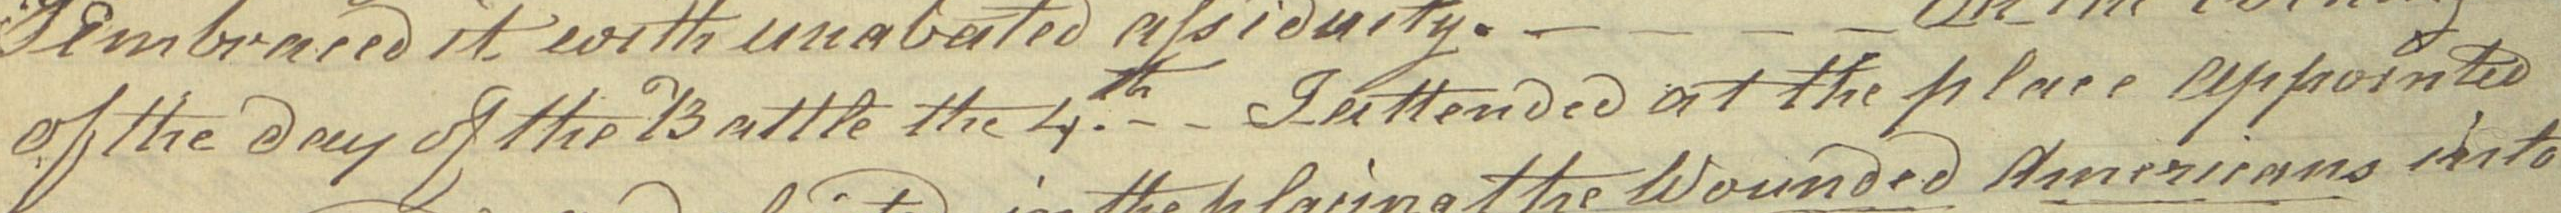of the day of the Battle the 4^th.- I attended at the place appointed
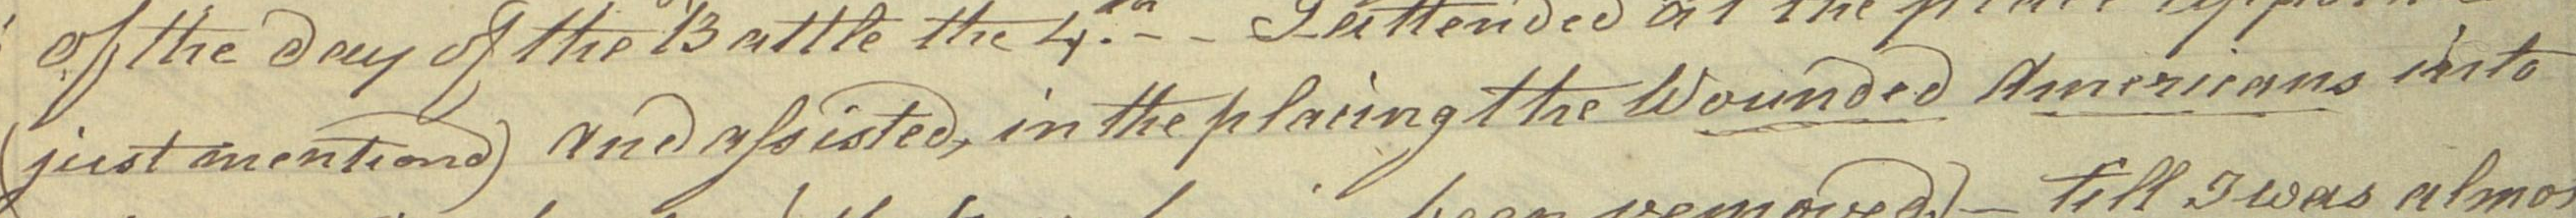(just mentiond) and assisted, in the placing the Wounded Americans into
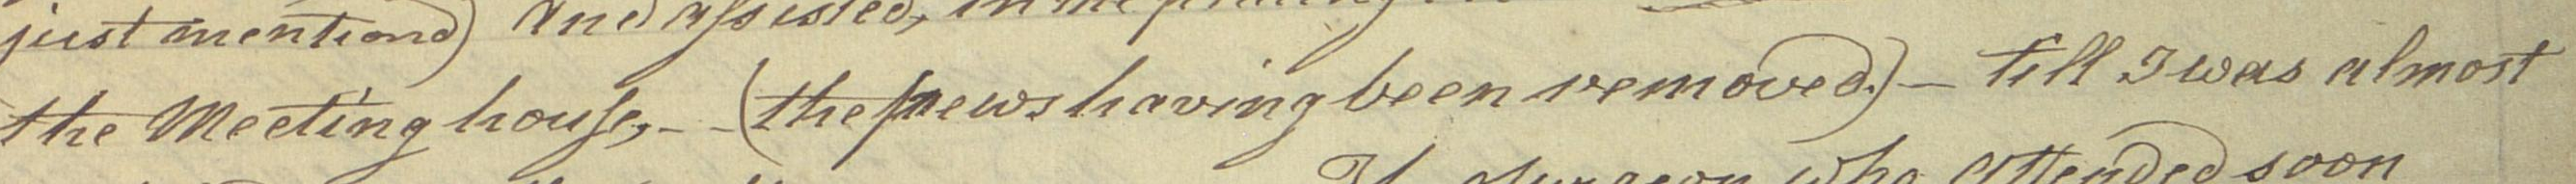the Meeting house, (the pews having been removed.) till I was almost
